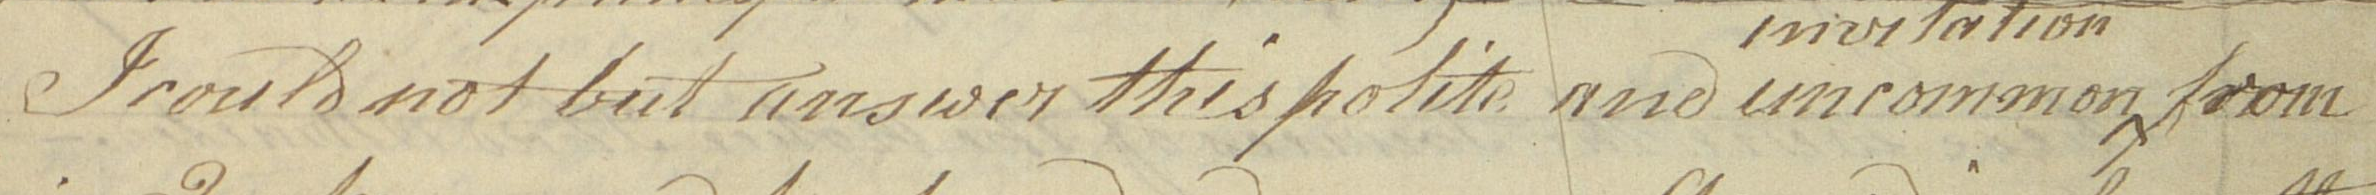I could not but answer this polite and uncommon ^ from
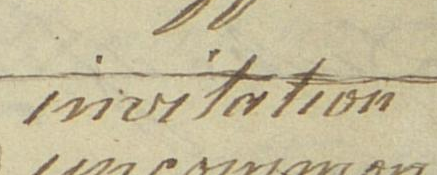invitation
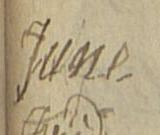June
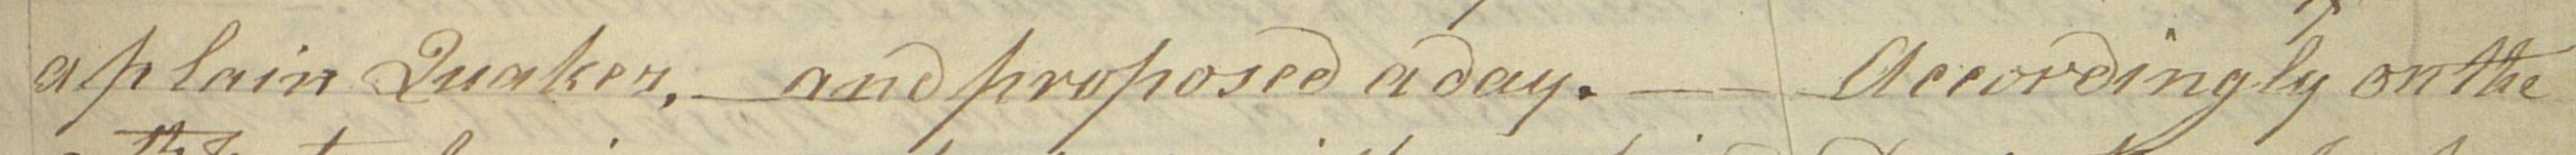a plain Quaker, and proposed a day. Accordingly on the
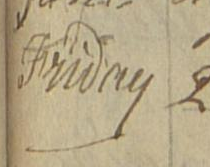Friday
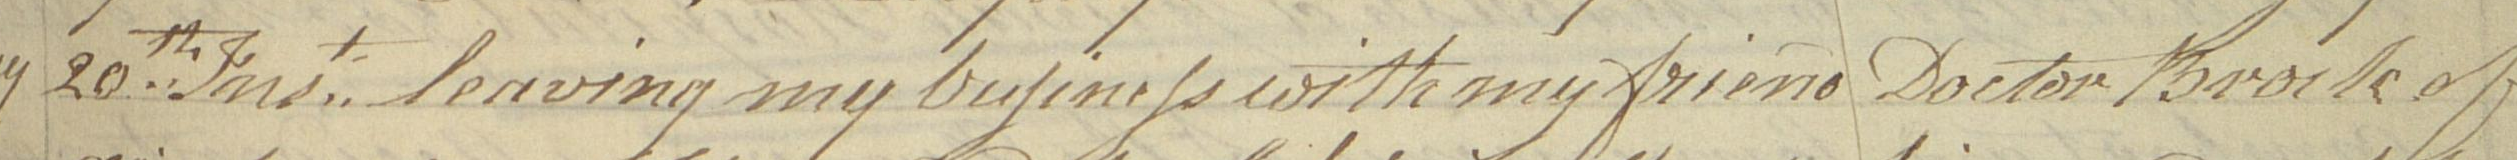20^th. Ins^t. leaving my business with my friend Doctor Brock of
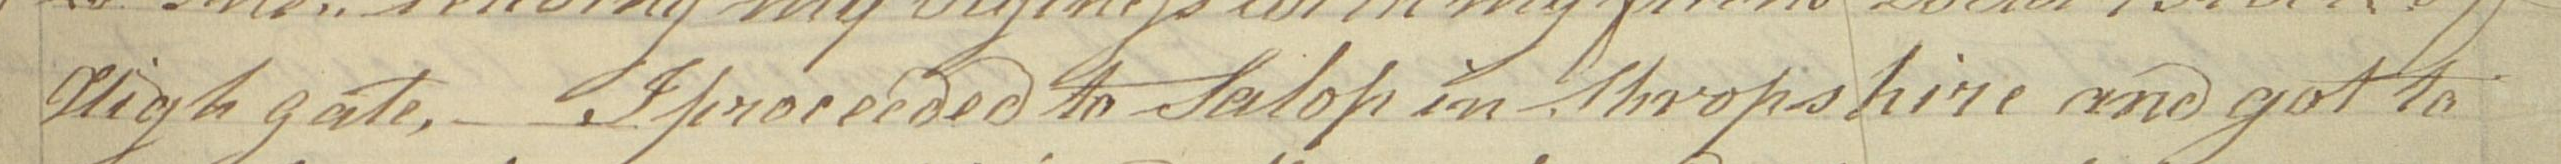High gate, I proceeded to Salop in Shropshire and got to
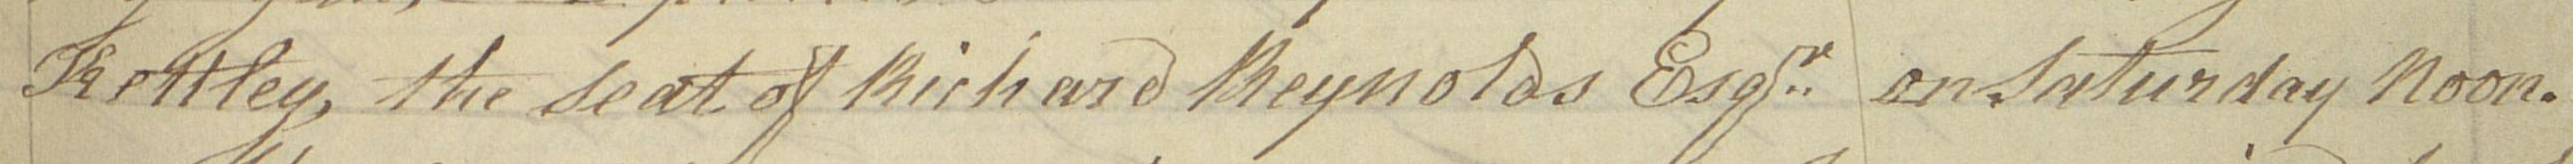Kettley, the Seat of Richard Reynolds Esq^r. on Saturday Noon
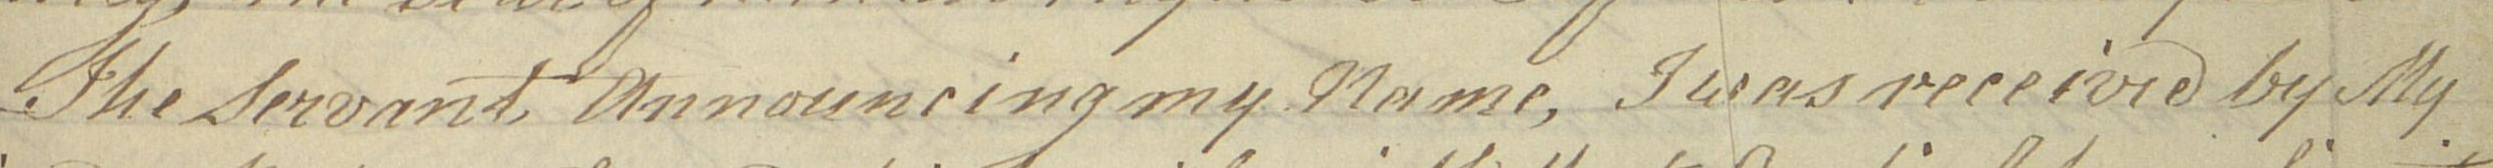The servant Announcing my Name, I was received by My
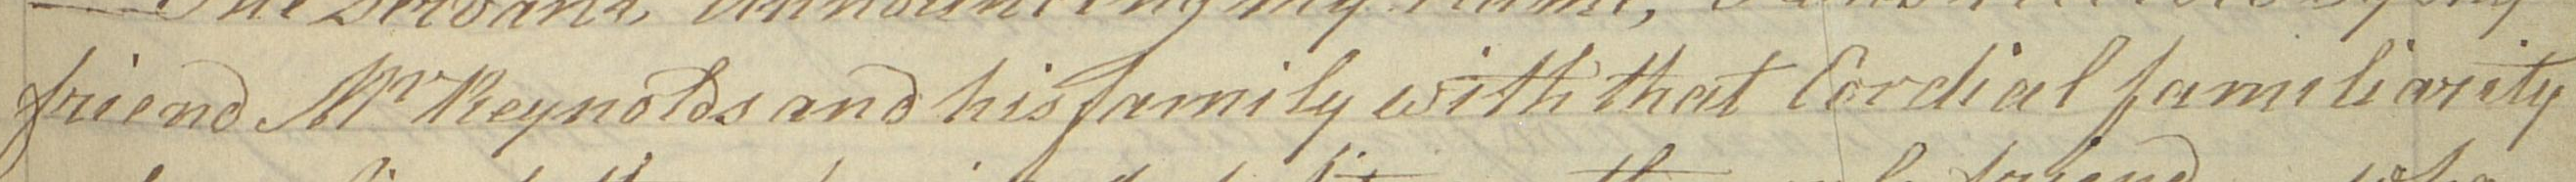friend M^r. Reynolds and his family with that Cordial familiarity
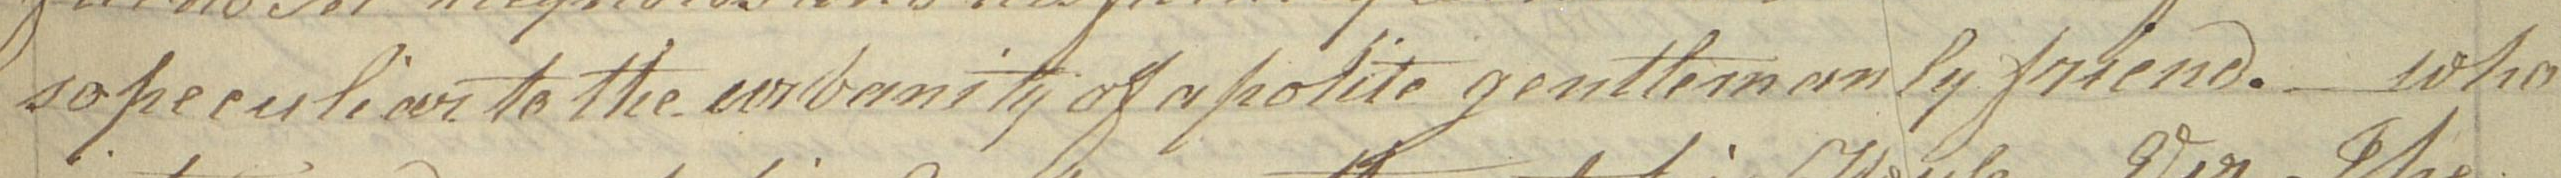so peculiar to the urbanity of a polite gentlemanly friend. who
